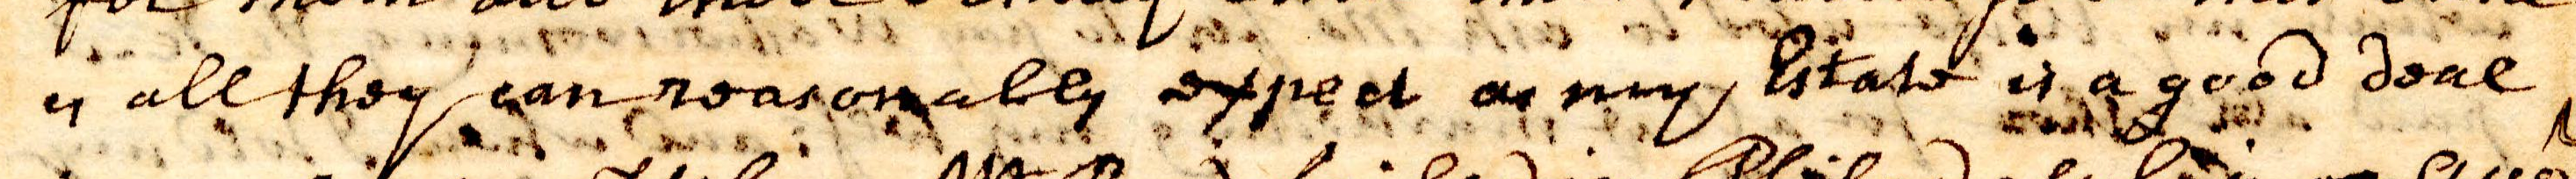is all they can reasonably expect as my Estate is a good deal
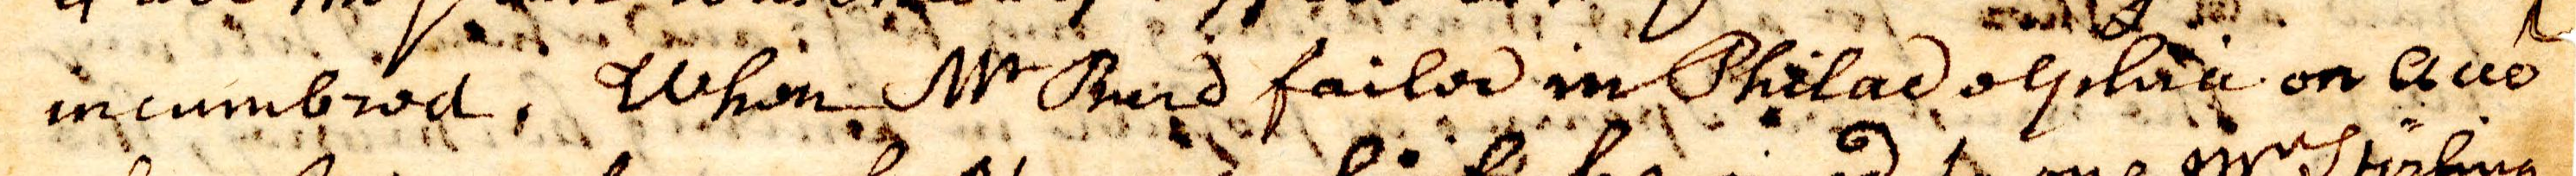incumbred. When M^r Burd failed in Philadelphia on Acco^t
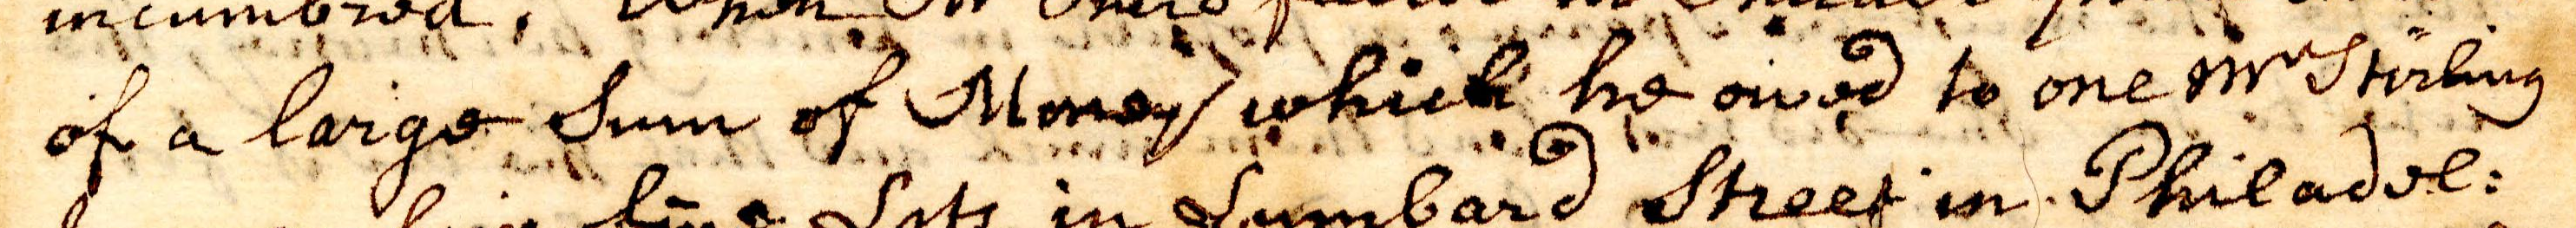of a large sum of Money which he owed to one M^r Stirling
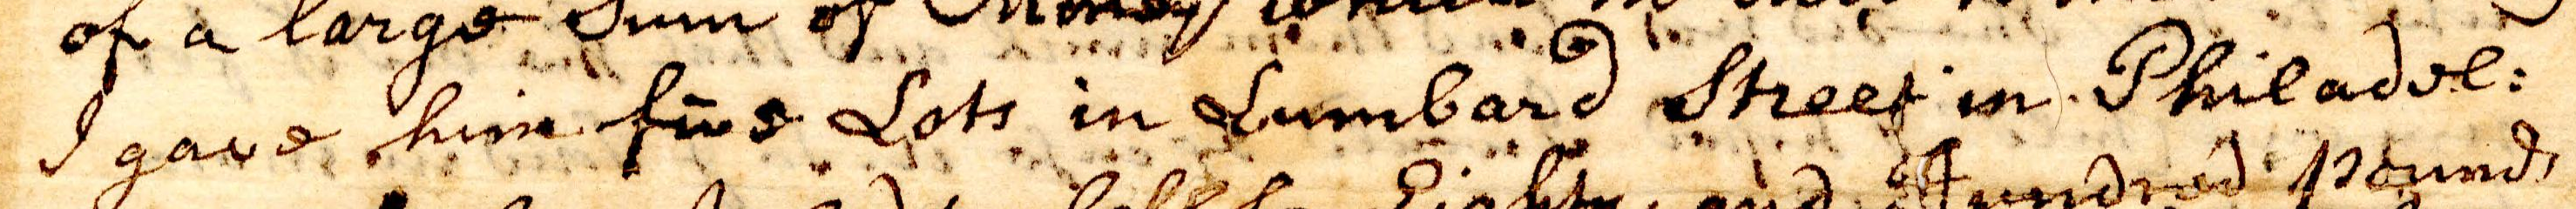I gave him five Lots in Lumbard Street in Philadel:
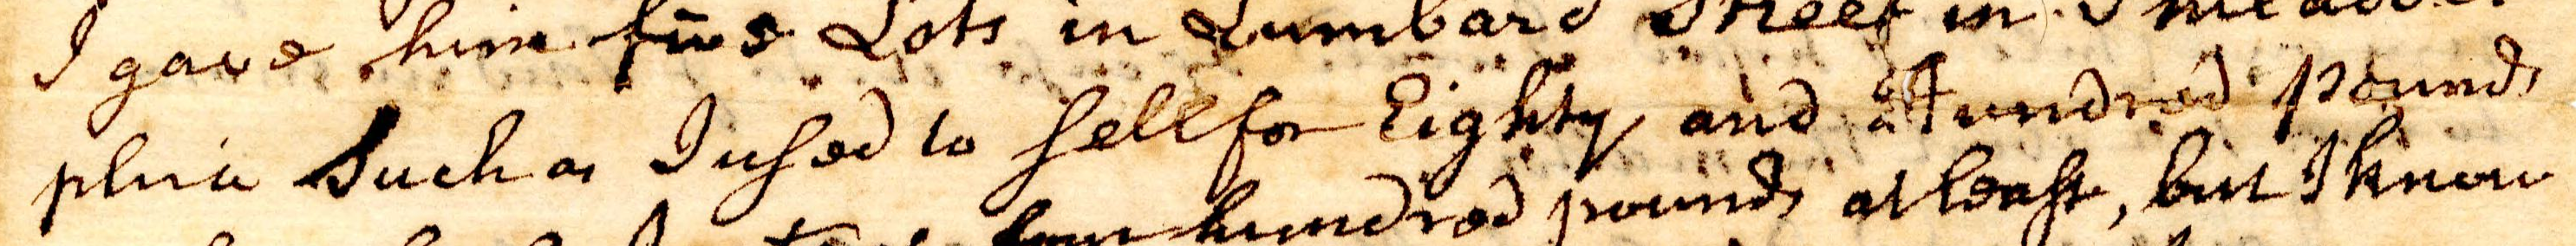phia such as I used to sell for Eighty and Hundred pounds
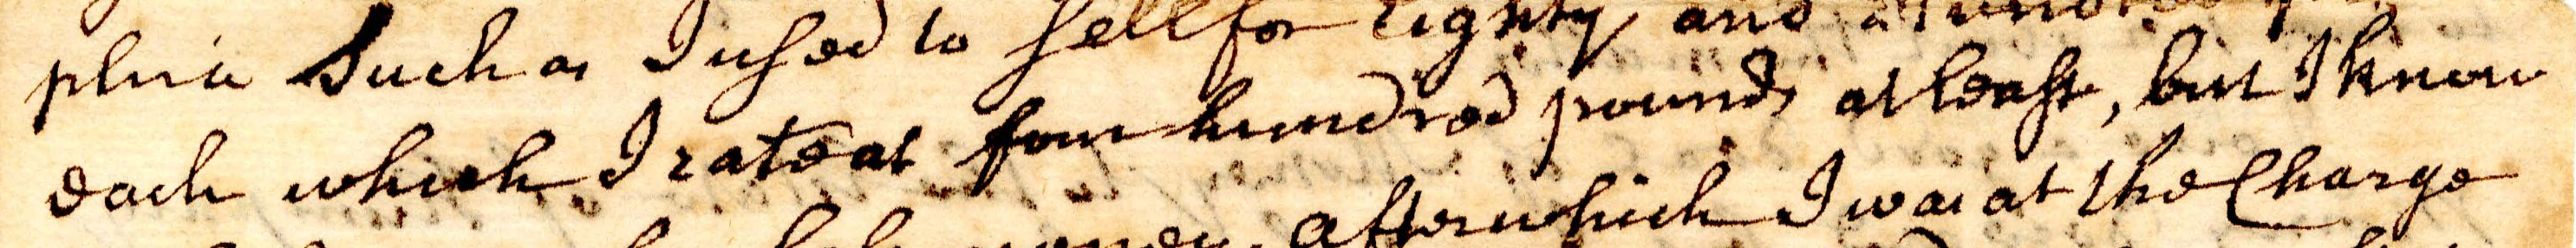each which I rate as four hundred pounds at least, but I know
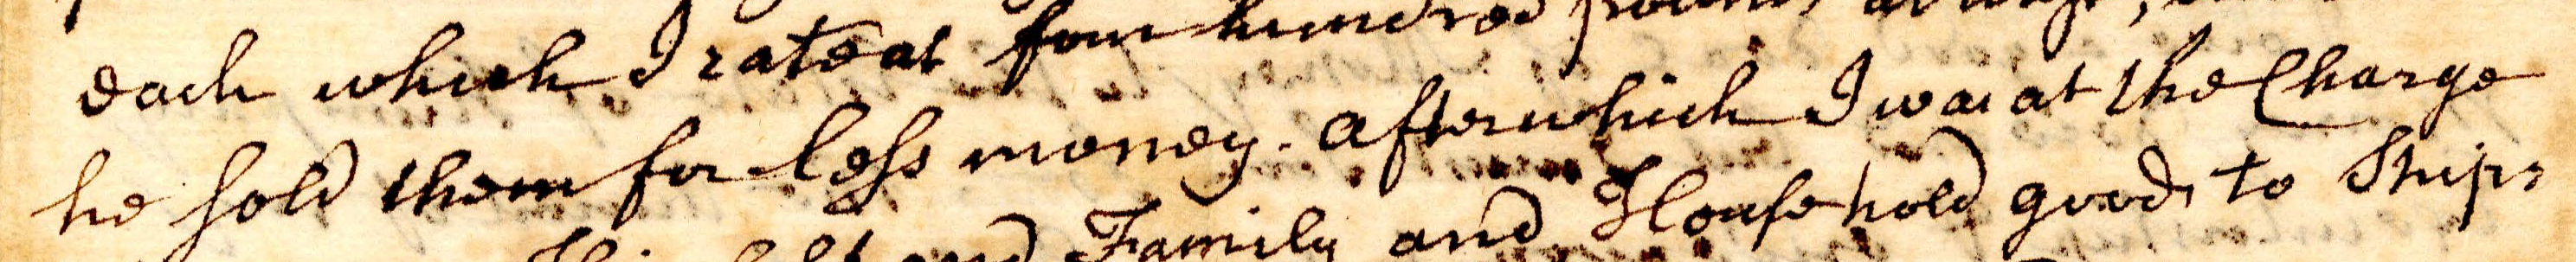he sold them for less money. After which I was at the Charge
